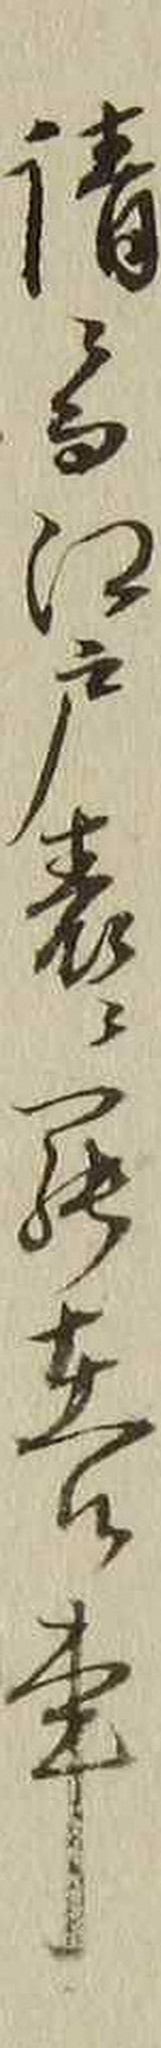請ニ而江戸表ニ罷在候事
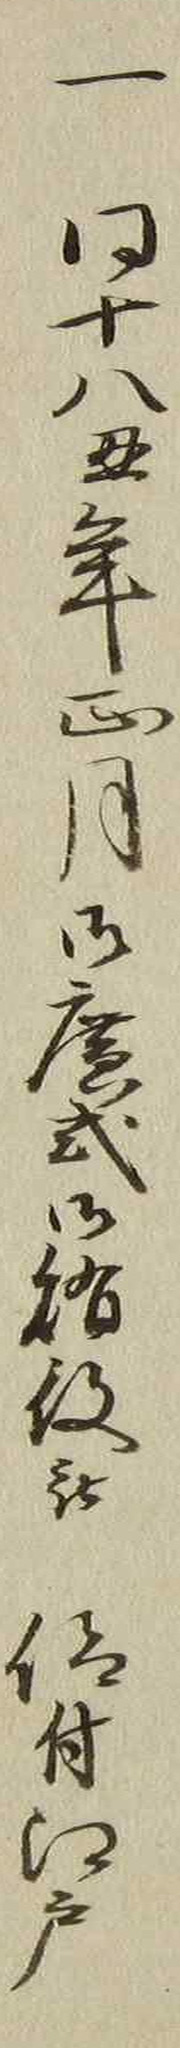一同十八丑年正月御広式御賄役被仰付江戸
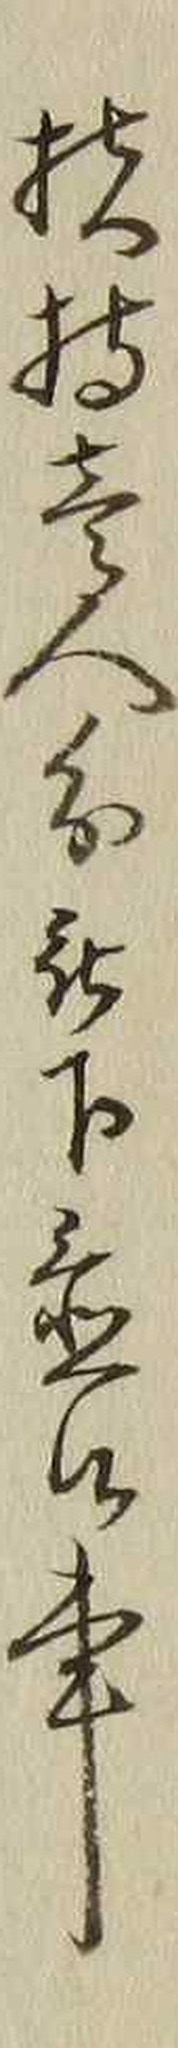扶持壱人分被下置候事
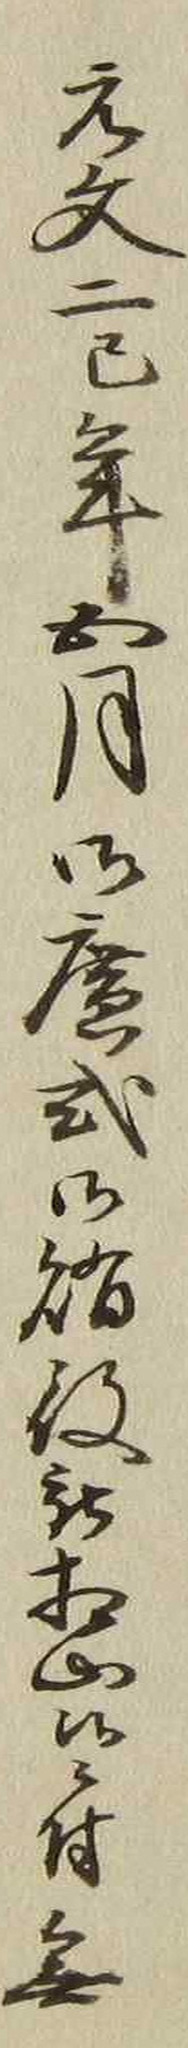一元文ニ巳年五月御広式御賄役被相止候ニ付無
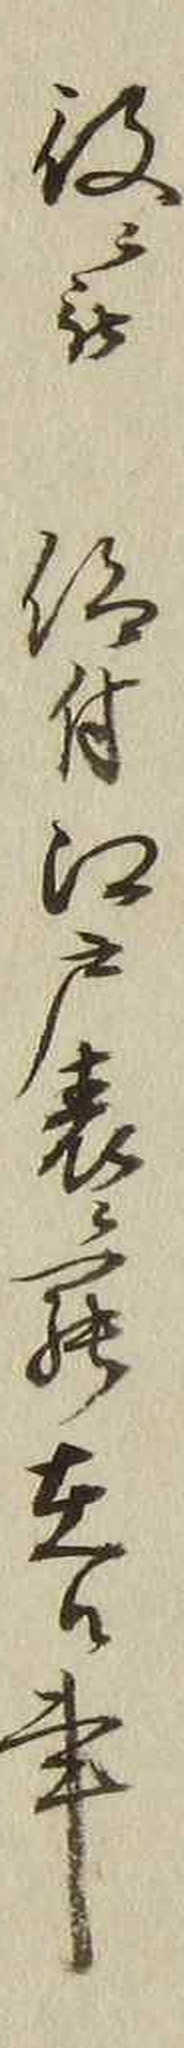役ニ被仰付江戸表ニ罷在候事
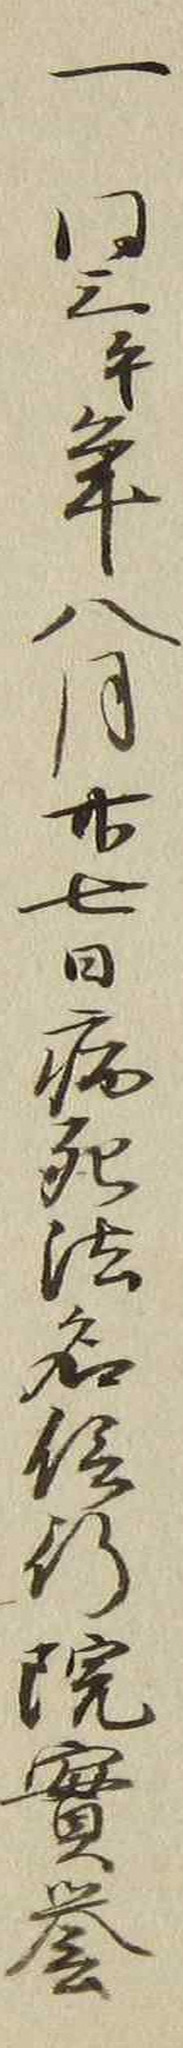一同三午年八月廿七日病死法名信行院実誉
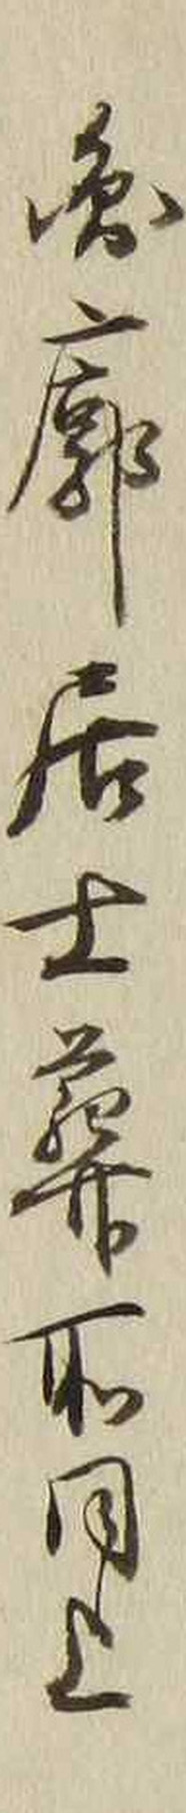円廓居士葬所同上

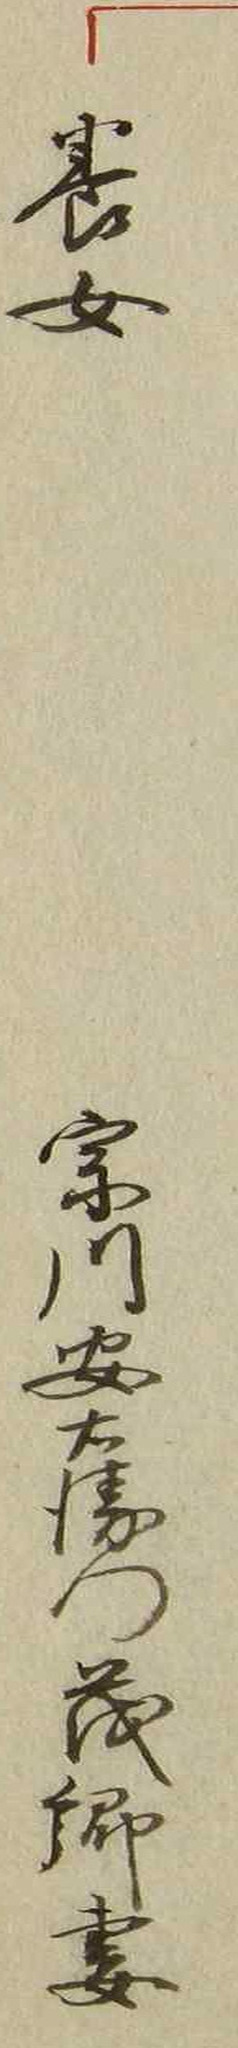養女宗川安右衛門茂郷妻
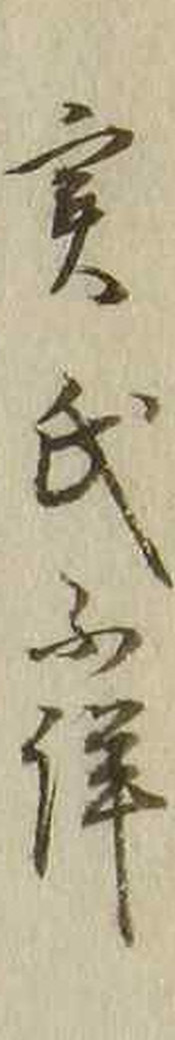実氏ふ詳
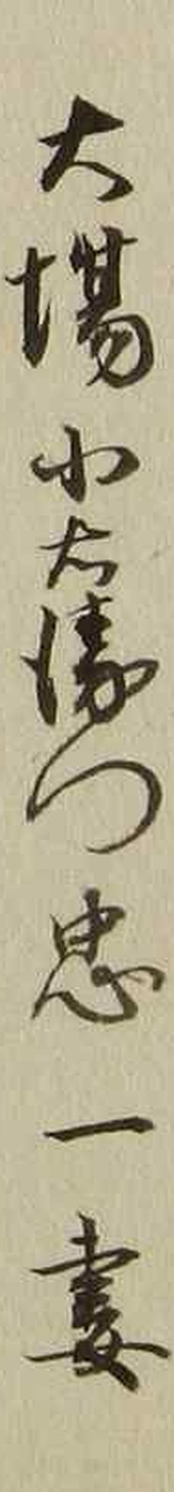女大場小右衛門忠一妻
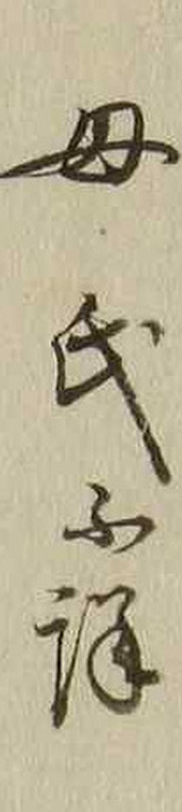母氏ふ詳
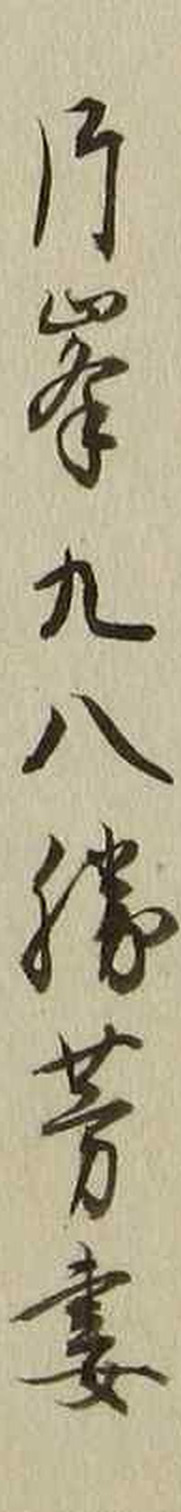女片峯九八勝芳妻
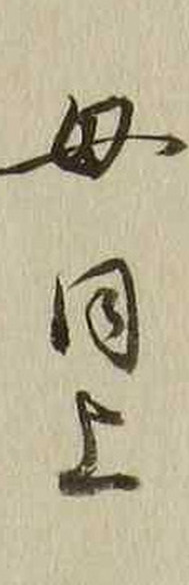母同上
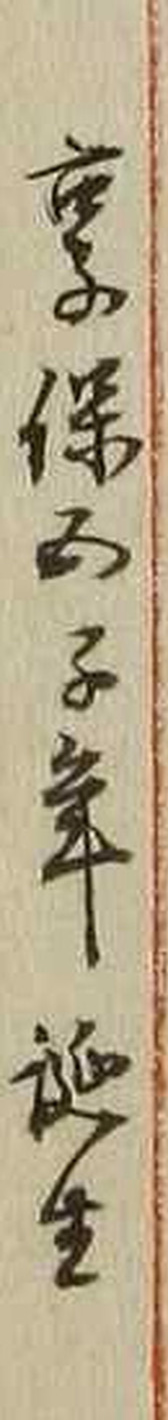享保五子年誕生
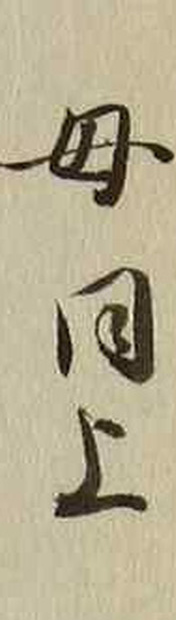母同上
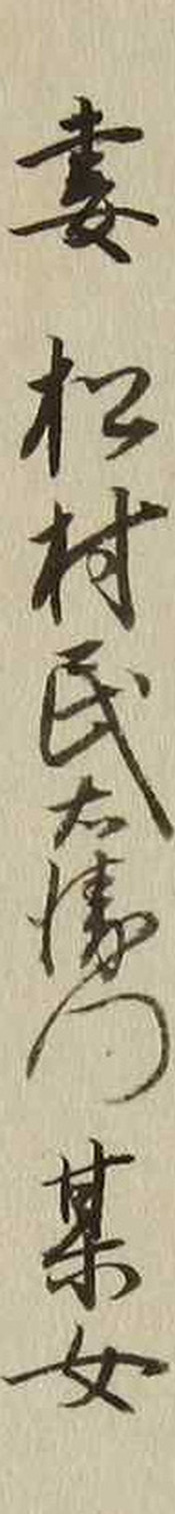妻松村民右衛門某女
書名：諸士系譜　巻之114　か之部22
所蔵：会津若松市立会津図書館
